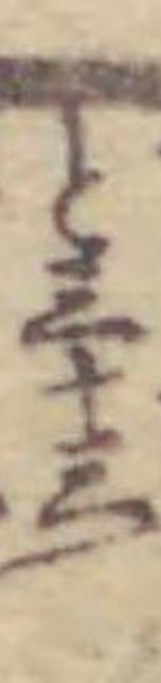と三十三
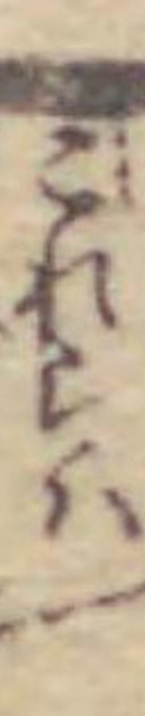これらは
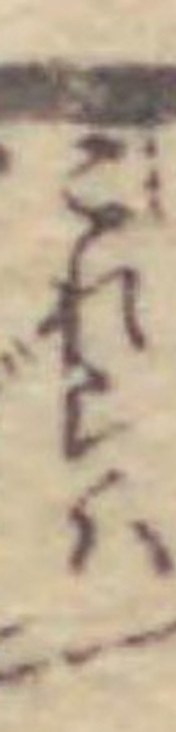これらは
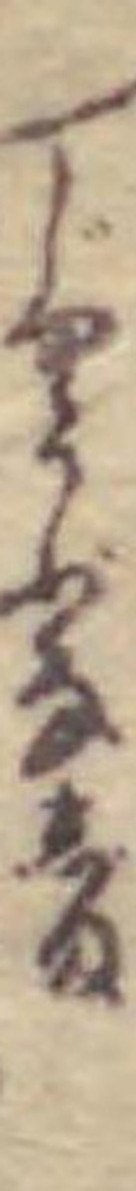じやうぶなしま
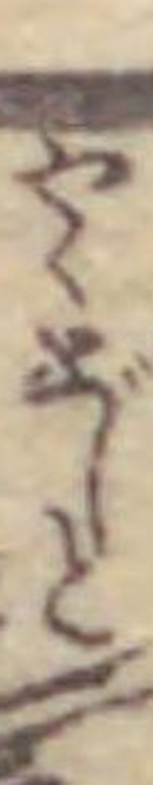やくどしと
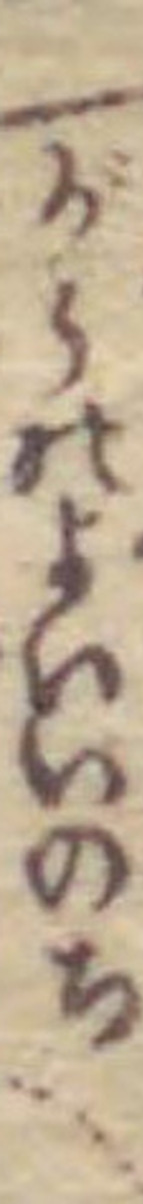がらのよいいのち
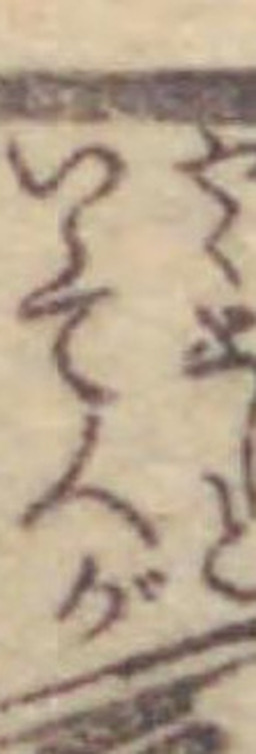いゝて人が
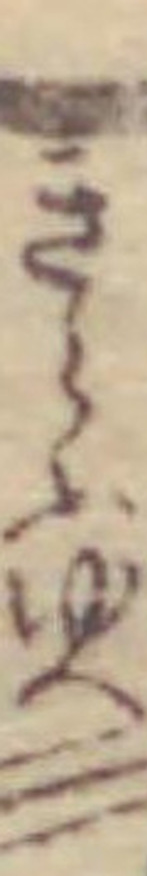きらふゆへ
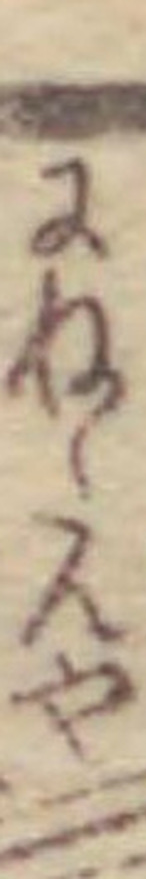にねたんや
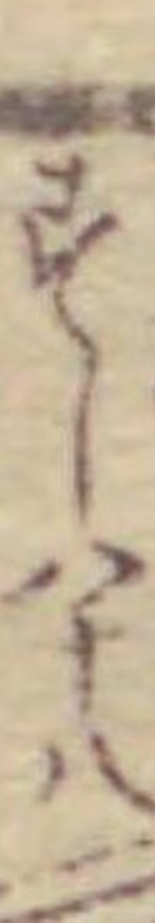すし八十八
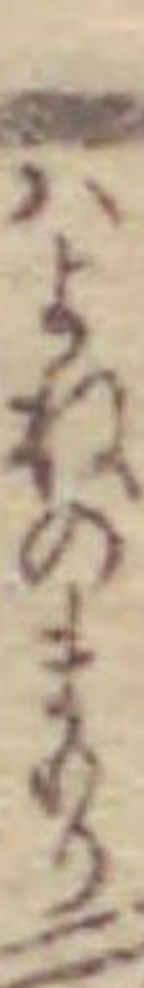はよねのまもり
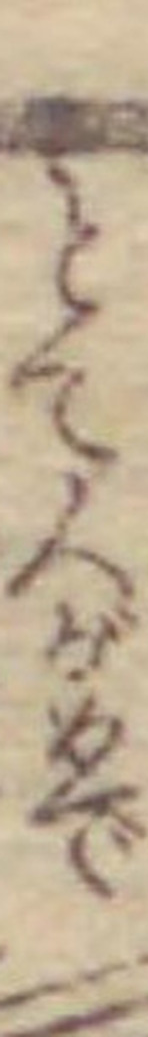とて人がめで
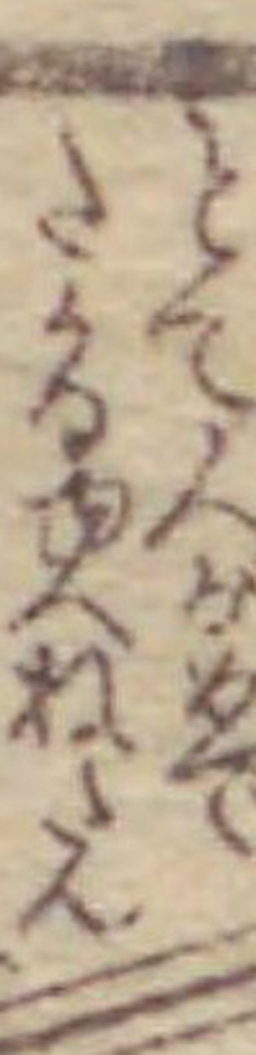たかるゆへねたん
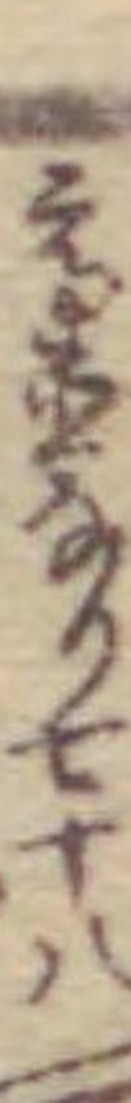高直なり七十八
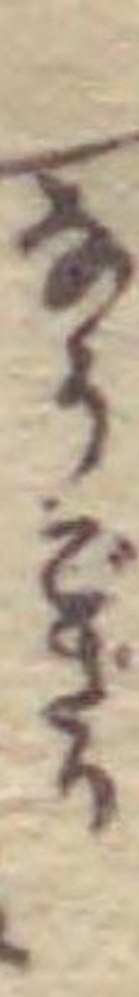なうごさり
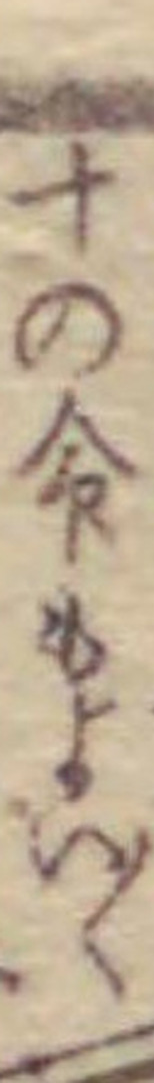十の命もよい〳〵
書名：御誂染長寿小紋 : 3巻
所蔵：国立国会図書館 National Diet Library, JAPAN
